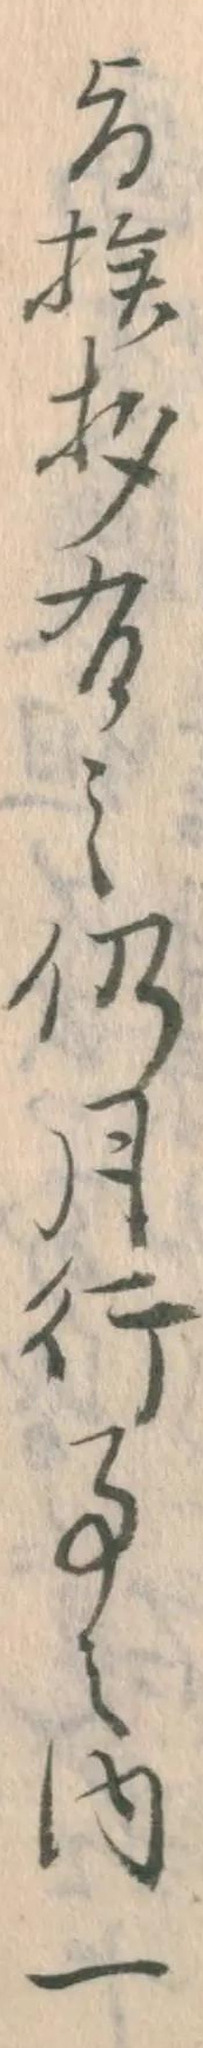旨挨拶有之仍月行事之内一
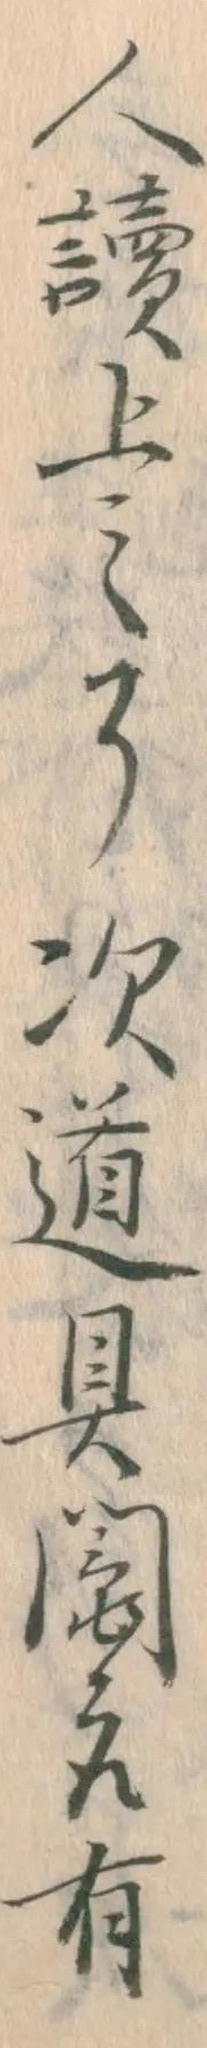人読上之了次道具鬮取有
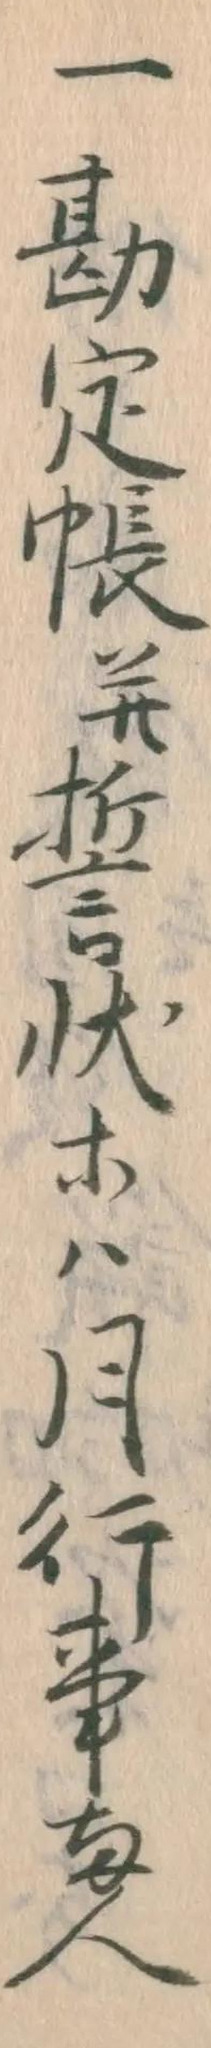一勘定帳并誓状等は月行事両人
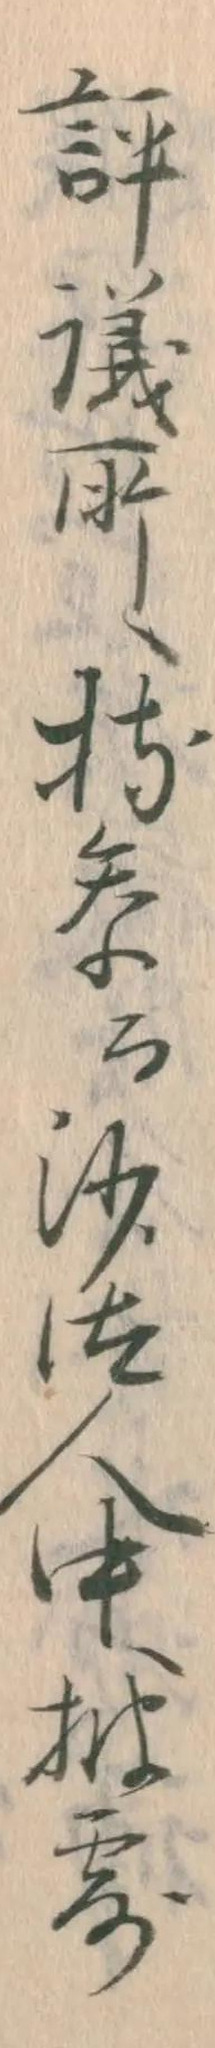評議所へ持参而沙汰人中へ披露
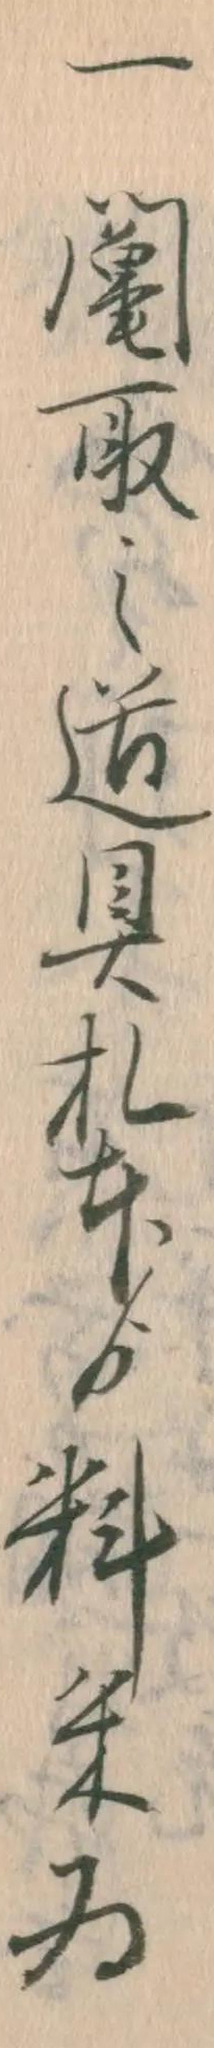一鬮取之道具札本ゟ料米為
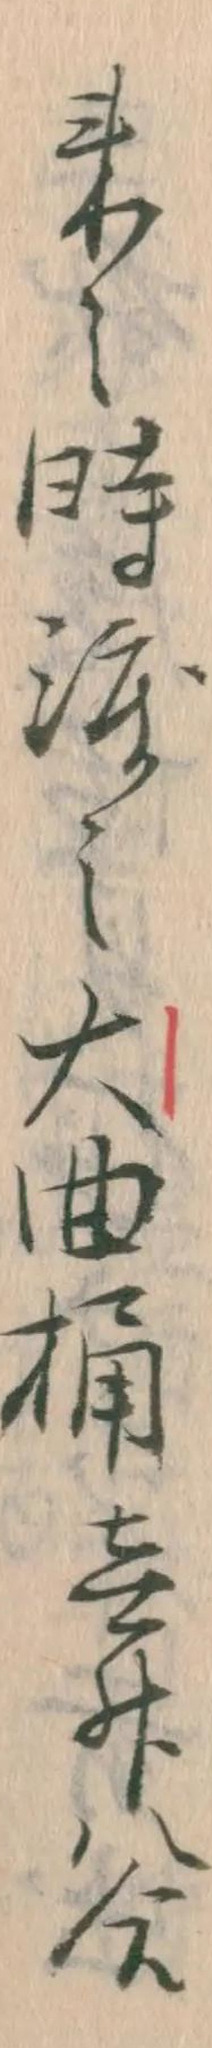来之時渡之大曲桶壱升八合
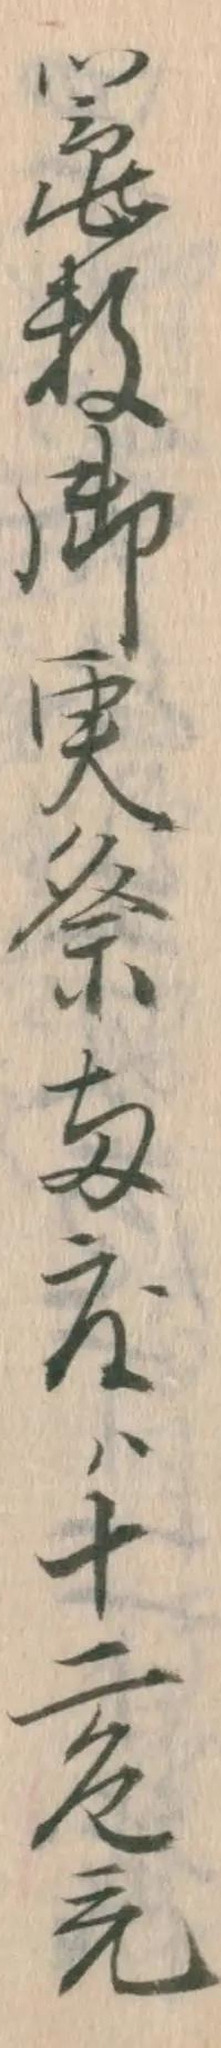鬮数御更祭両度は十二色充
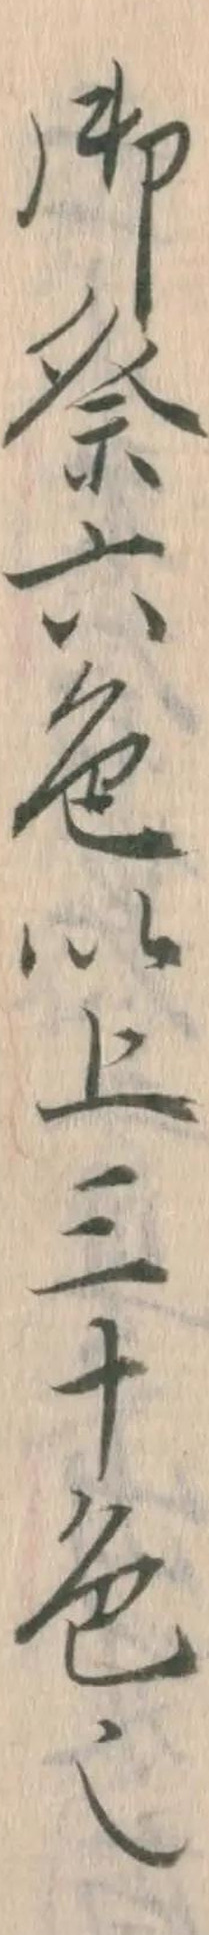御祭六色以上三十色也
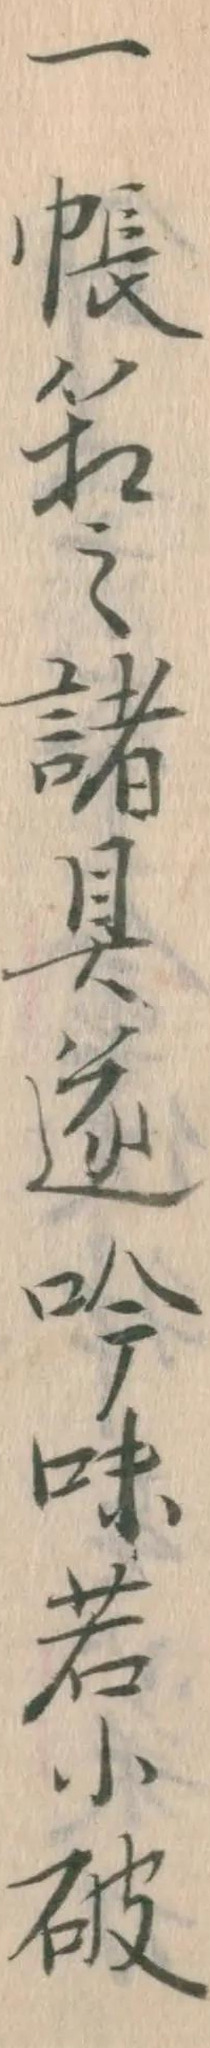一帳箱之諸具遂吟味若小破
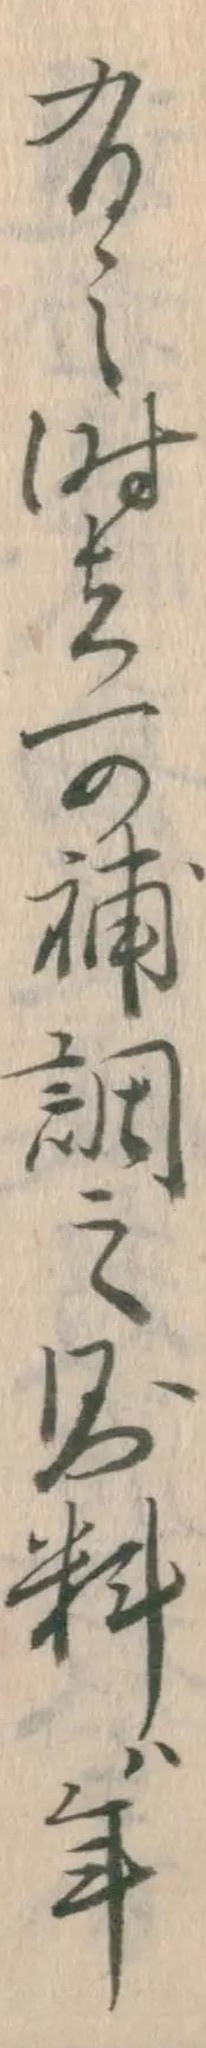有之時者可補調之則料は年
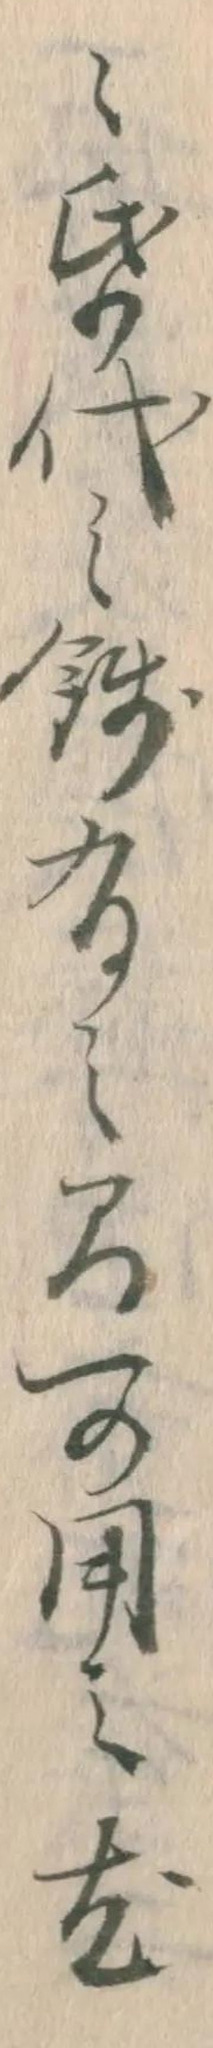々紙代之銭有之間可用之尤
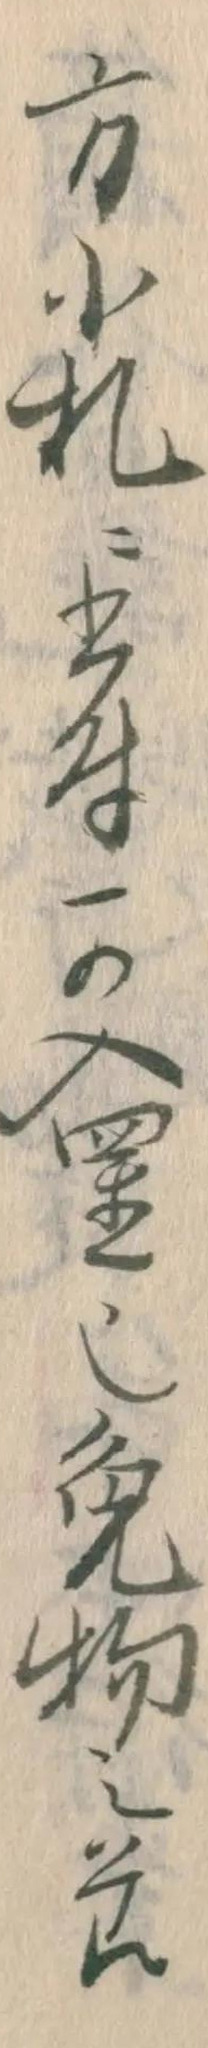方小札に書付可入置也免物之節
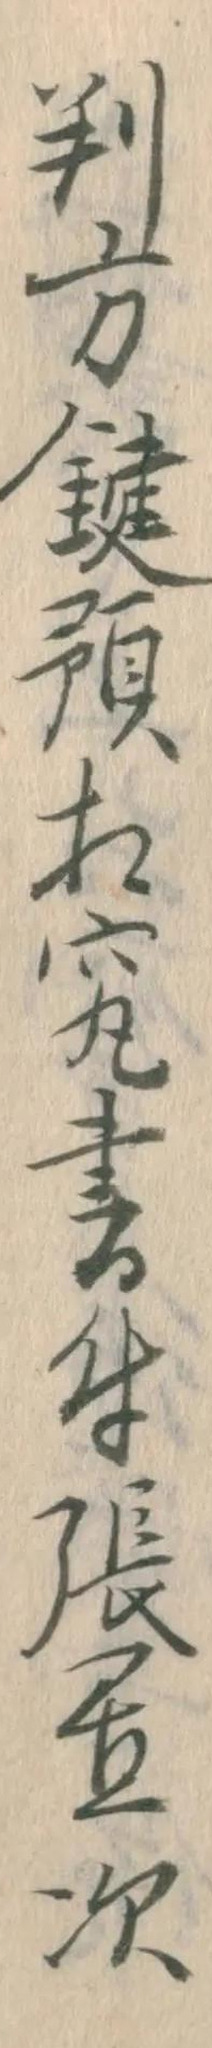判方鍵預相究書付張置次
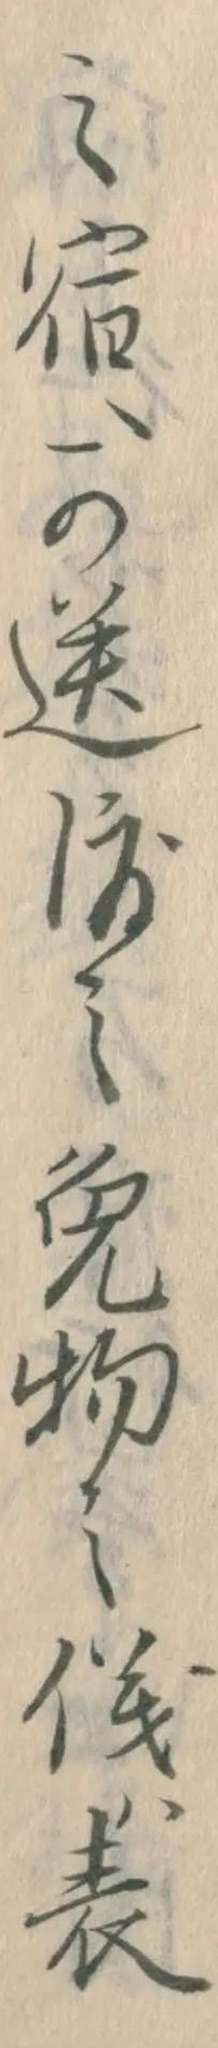之宿へ可送渡之免物之儀は表

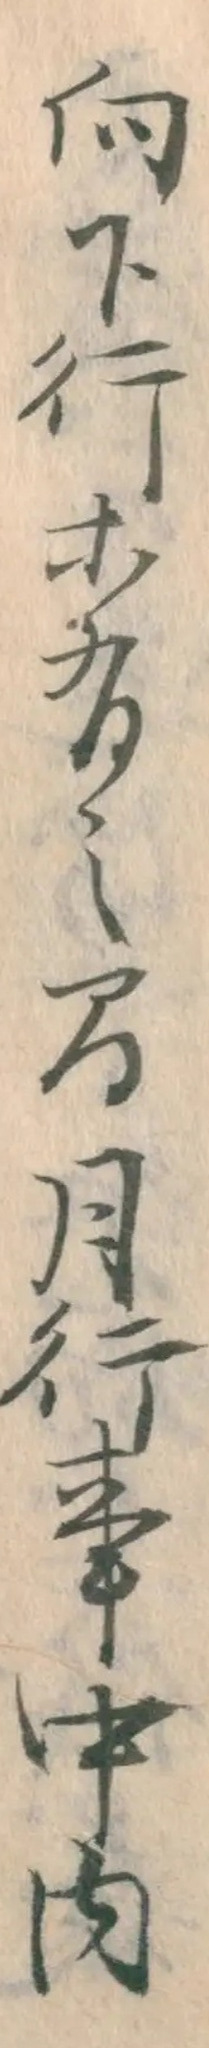向下行等有之間月行事中内
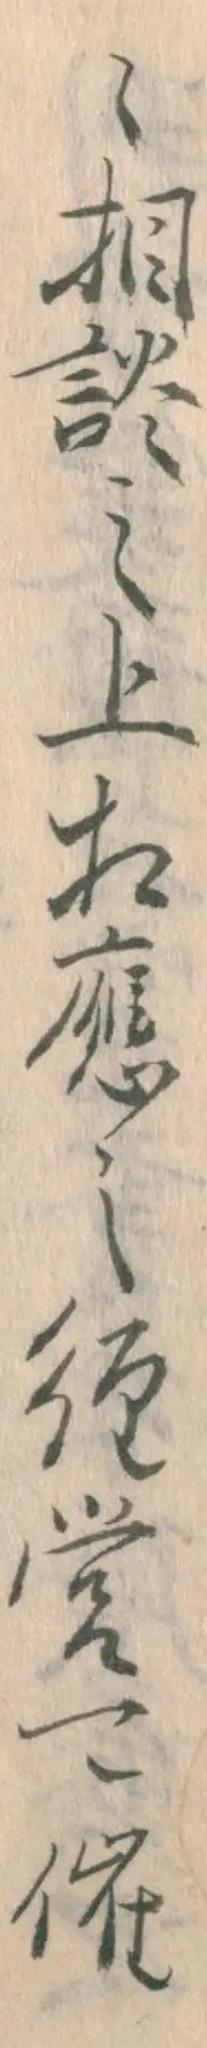々相談之上相応之経営可催
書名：賀茂社記録. 第81冊
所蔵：国立国会図書館 National Diet Library, JAPAN
